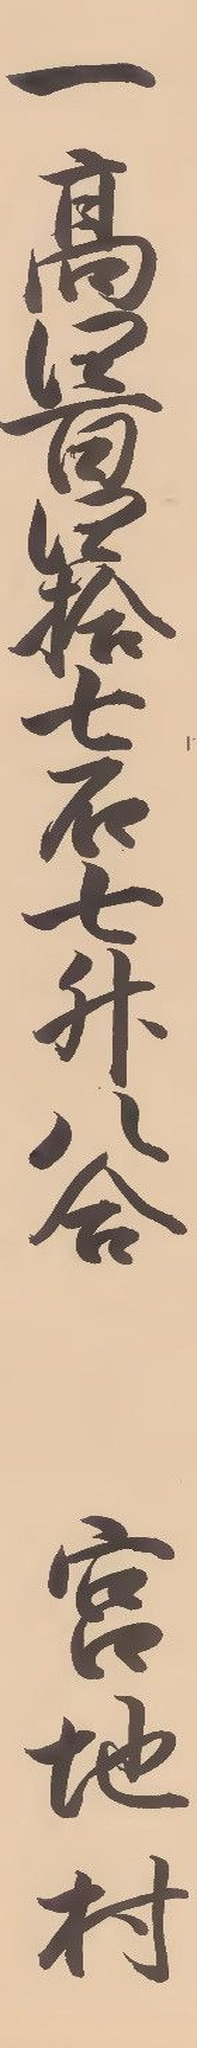一髙四百四拾七石七升八合宮地村
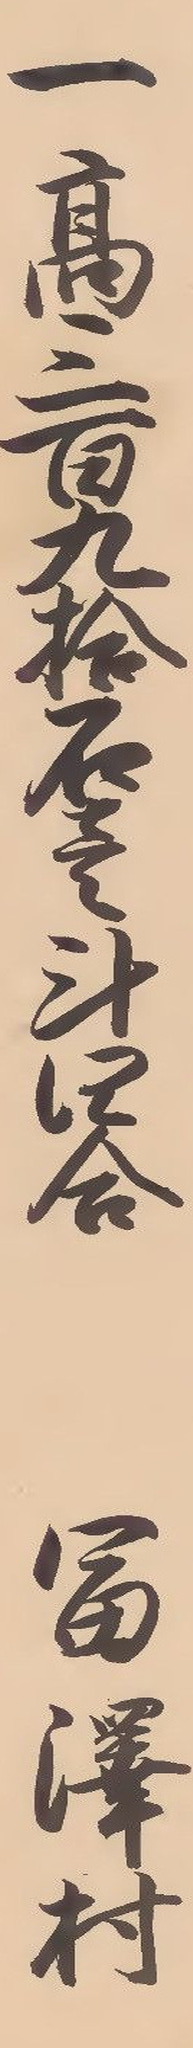一髙三百九拾石壱斗四合冨津村

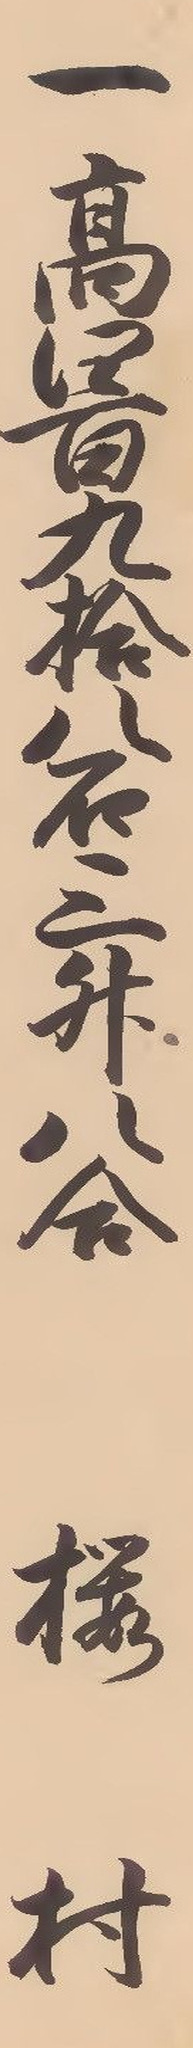一髙四百九拾八石三升八合櫻村
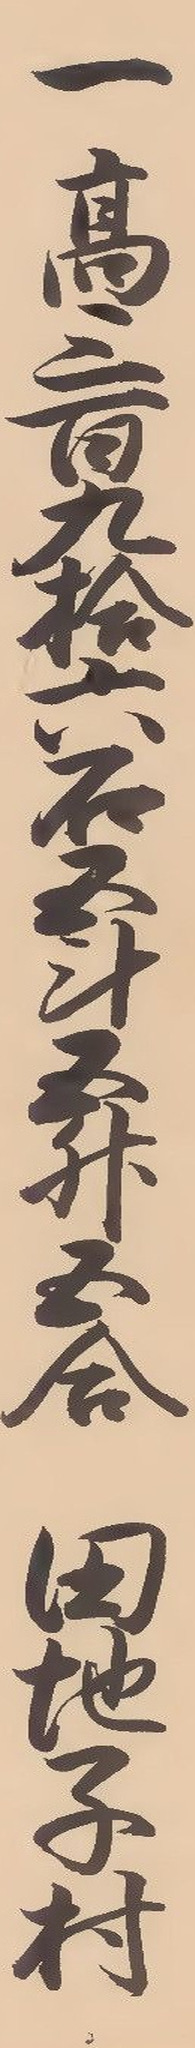一髙三百九拾六石五斗五升五合団地子村
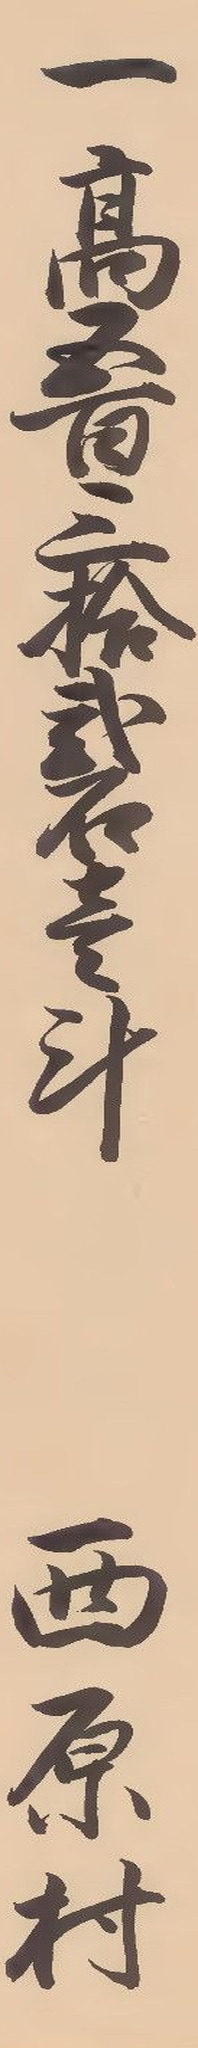一髙五百三拾弐石壱斗西原村
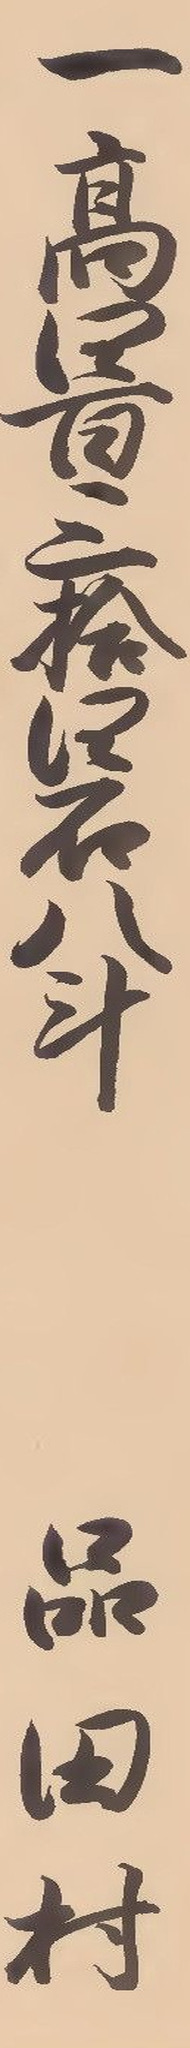一髙四百三拾四石八斗品田村
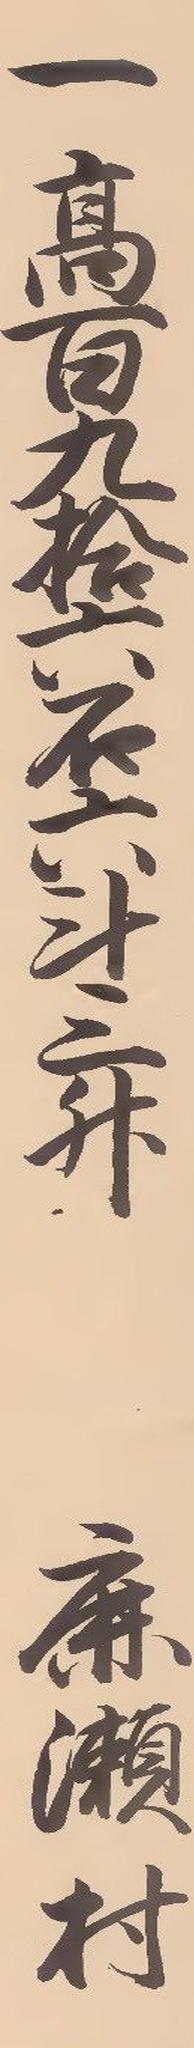一髙百九拾六石六斗三升鹿瀬村
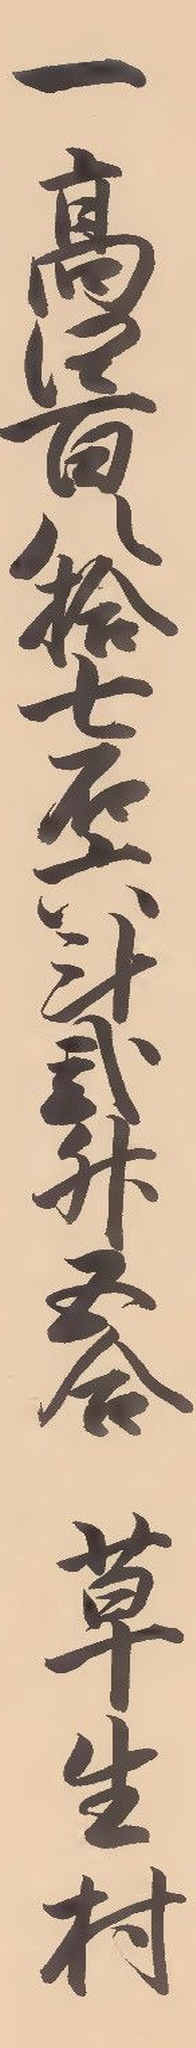一髙四百八拾七石六斗弐升五合草生村
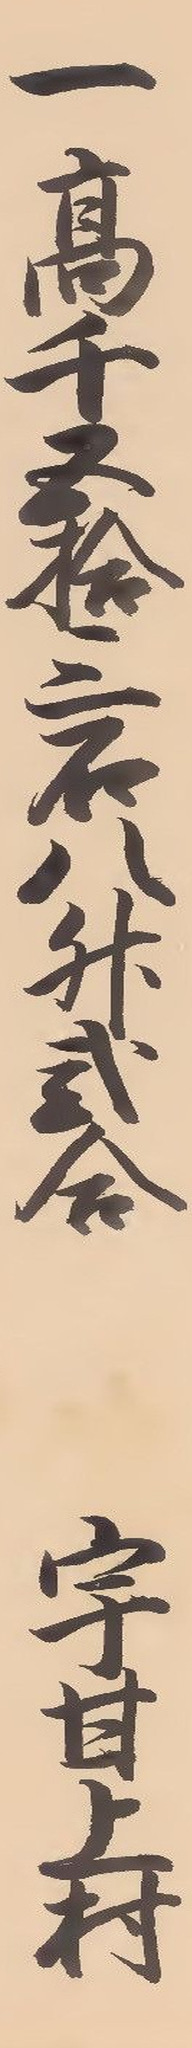一髙千五拾三石八升弐合宇甘上村
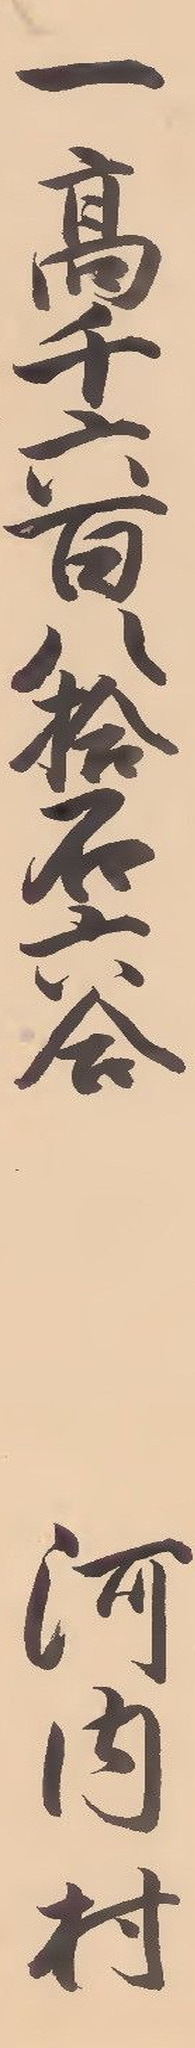一髙千六百八拾石六合河内村

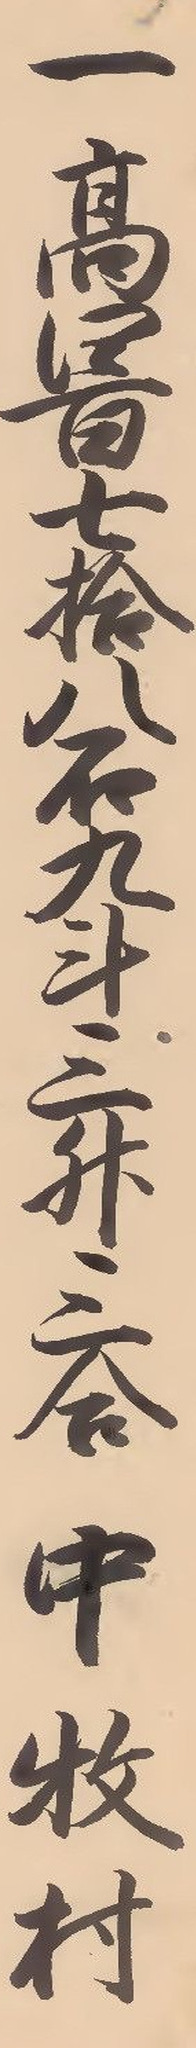一髙四百七拾八石九斗三升三合中牧村
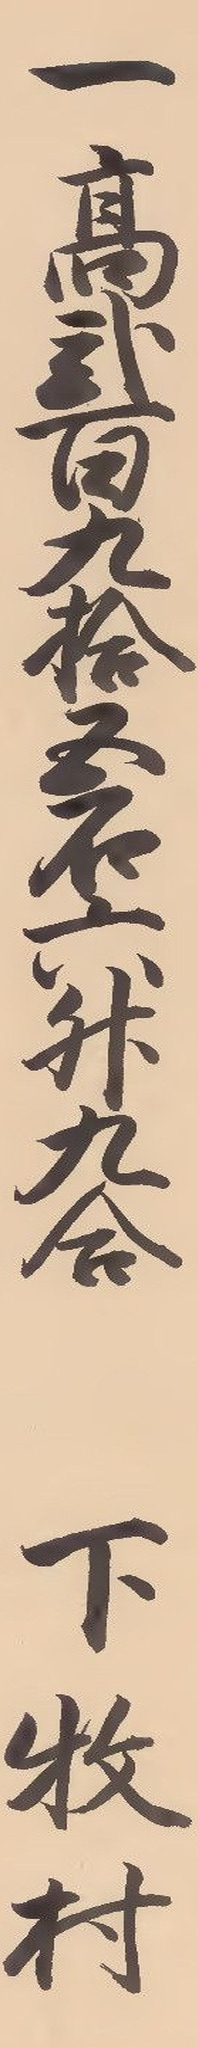一髙弐百九拾五石六升九合下牧村
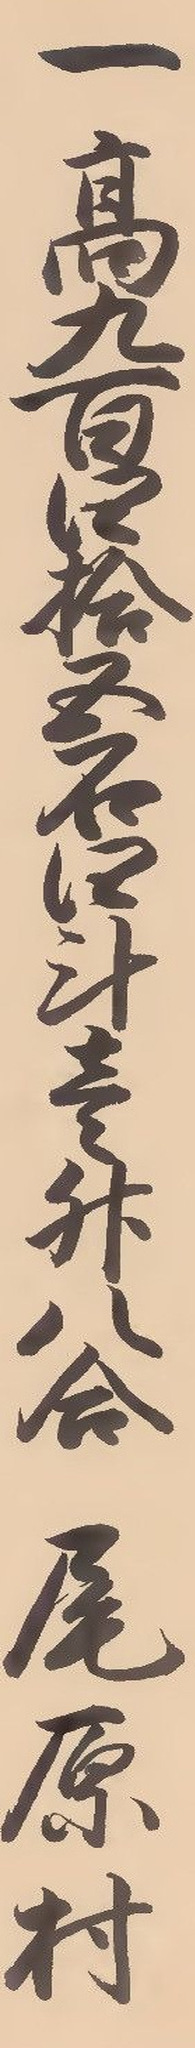一髙九百四拾五石四斗壱升八合尾原村
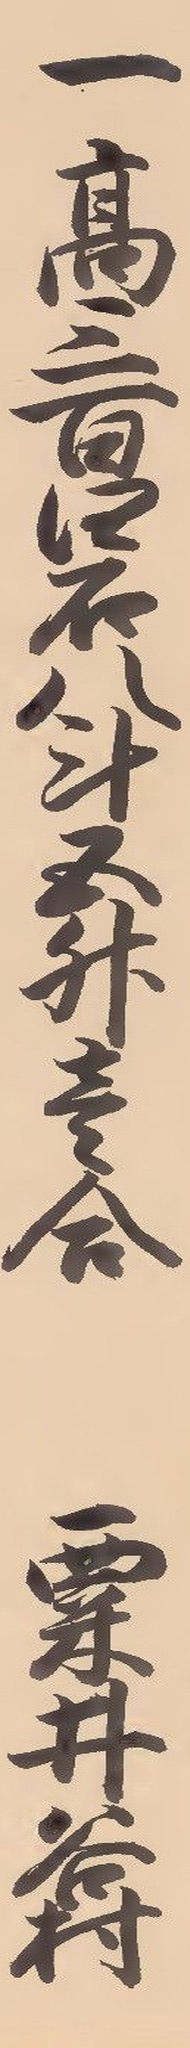一髙三百四石八斗五升壱合粟井谷村
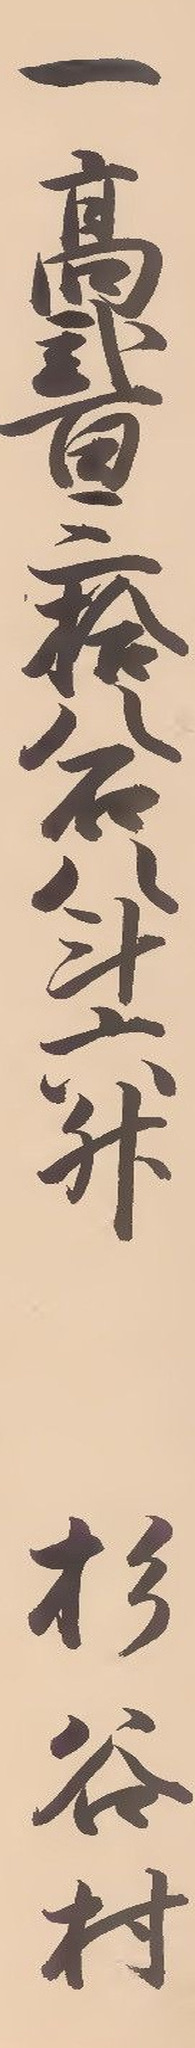一髙弐百三拾八石八斗六升杉谷村
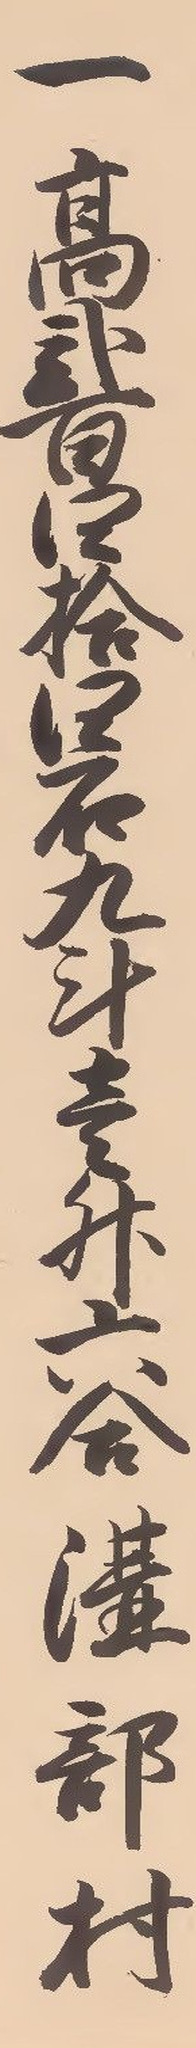一髙弐百四拾四石九斗壱升六合溝部村
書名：備前国郷帳
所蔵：国立公文書館 National Archives of Japan
